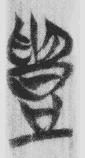豊
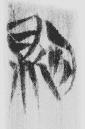則
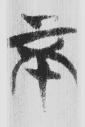不
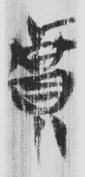貴
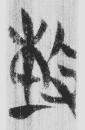{坴攴}
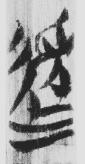{辶㸒}
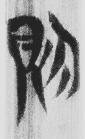則
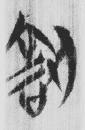割
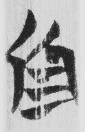於
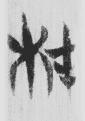材
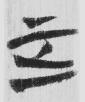正
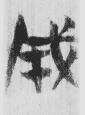成
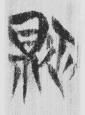則
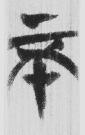不
